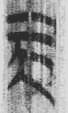天
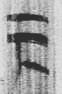下
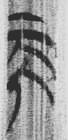而
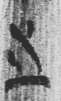之
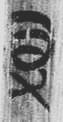○（得）
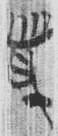○（一）
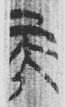而
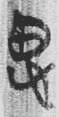思
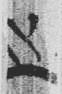之
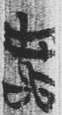若
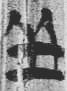并
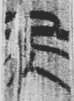天
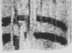下
